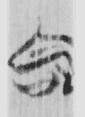命
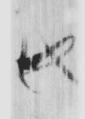女
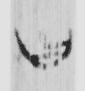曰
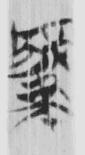肈
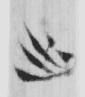出
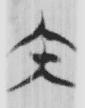內
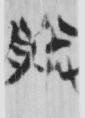朕
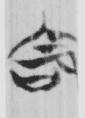命
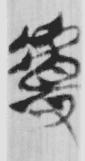{虍且又}
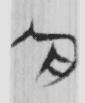今
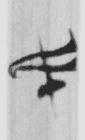民
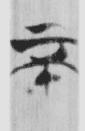不
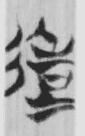造
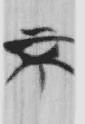不
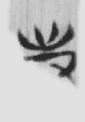庚
